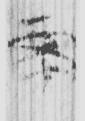不
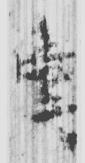危
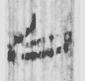㠯（以）
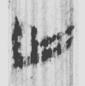亡
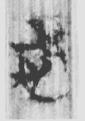{尤心}
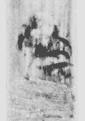於
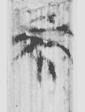天
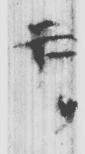下
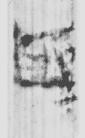聖
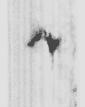人
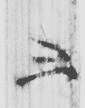之
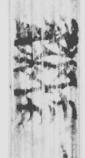{帶帶}
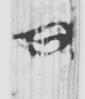日
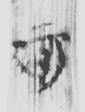可
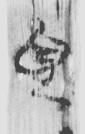見
